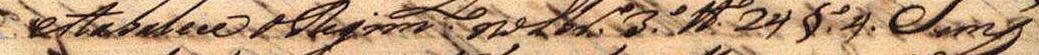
estabelece o Regim.to no Lbr.o 3.o tt.o 24 §.o 4. Sem q̄
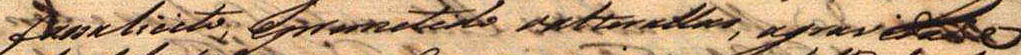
fosse licito, e prometido a alterallas, a gravidade
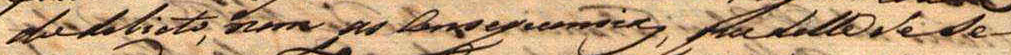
do delicto, nem as consequensias, que delle se se
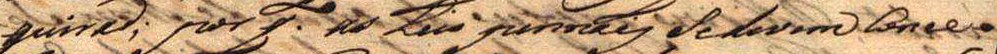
guiraõ; porq.to as Leis pennais se devem Conce
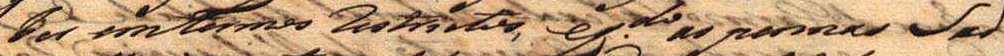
ber em termos Restrictos, e q.do as pennas Saõ
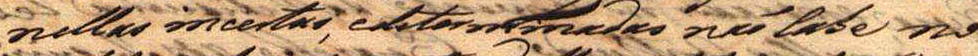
nellas incertas, e determinadas naõ Cabe no
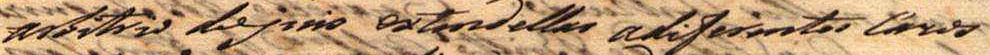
arbitrio do juis extendellas a diferentes Cazos
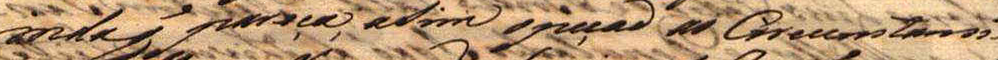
inda q̄ pareça, asim o peçaõ as Cercunstansi
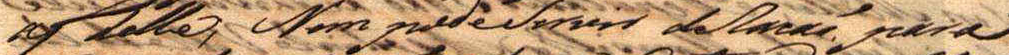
as delle; Nem pode seruir de Razaõ para
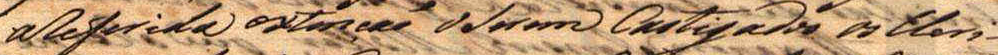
a Referida extençaõ o Serem Castigados os Cleri
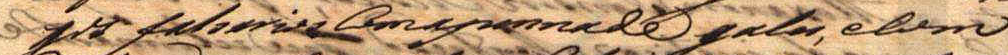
gos falsarios Com a penna de gales, e Com
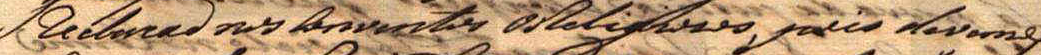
Recluzaõ nos Conventos os Religiozos, pois devemos
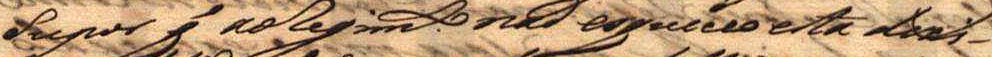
Supor q̄ ao Regim.to naõ esqueceo esta dezi
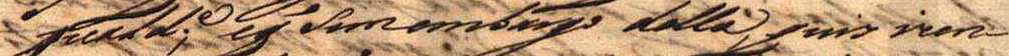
guald;e e q̄ sem embargo della, juiz izen
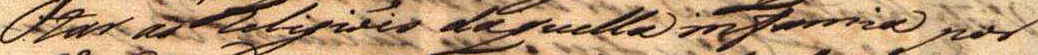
tar as Religiõis daquella infamia por
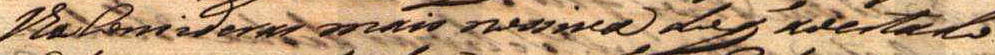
lha considerar mais nossiva do q̄ ao estado
